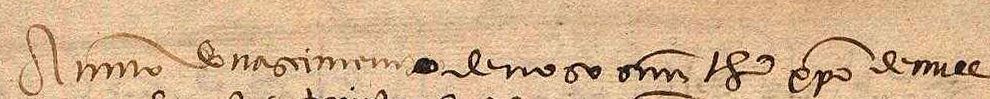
Anno do nascimemto de noso sn̄or Jhū xp̄o de mill
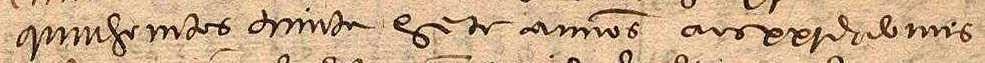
quinhemtos trinta e sete annos aos xxj di do mes
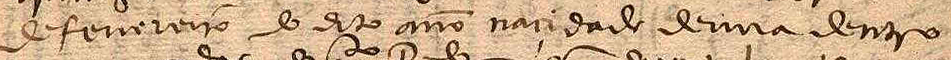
de feuereiro do dito ano na cidade deuora dentro
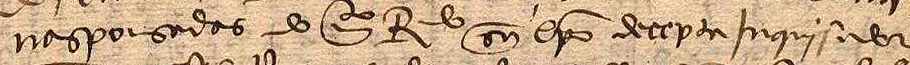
nas pousadas do mto Rdo s̄or bp̄o de cepta Jnqujsidor
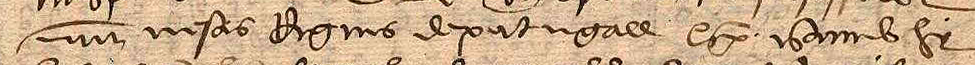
mor nestes Regnos de portugall e cꝭ̄ estamdo hy
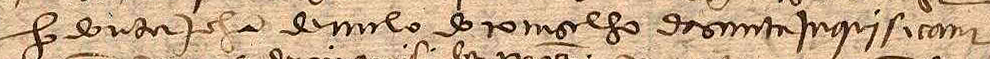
ho doutor Johā de melo do comselho da santa Jnqujsiçam
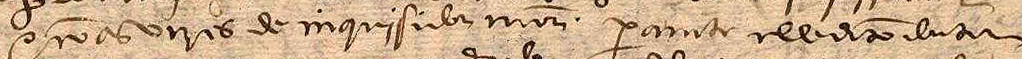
e c̄o as vezes de inqujsidor mor. ꝑamte elle dito doutor
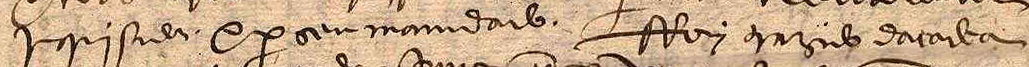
Jnqujsidor e ꝑ seu mamdado. ffoy trazido da cadea
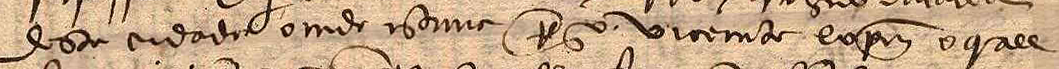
desta cidade omde estaua p̄so vicemte lopez o quall
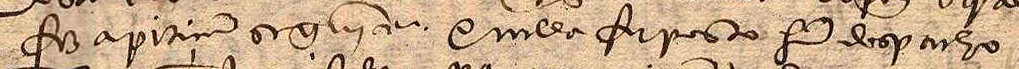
fez a pitiçā seguj̄te e nella foi posto hū despacho
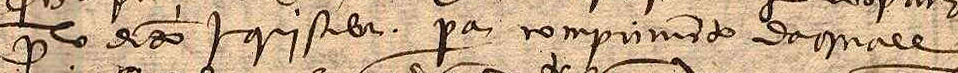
p̄lo dito Jnqujsidor ꝑa comprimēto da quall
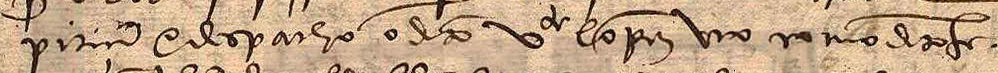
pitiçā e despacho o dito vte lopez veo como dito he
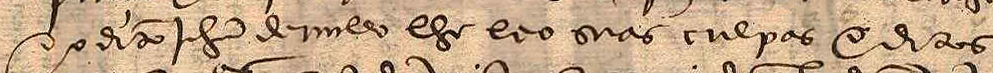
e o dito Johā de mello lhe leo suas culpas e ditos
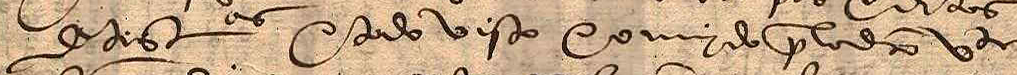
de testas e todo visto e ouujdo p̄lo dt̄o vte
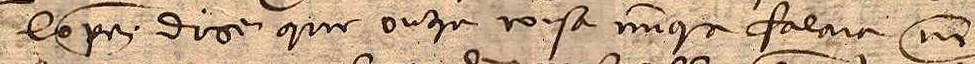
lopez dise que outra cousa nūqua falara nē
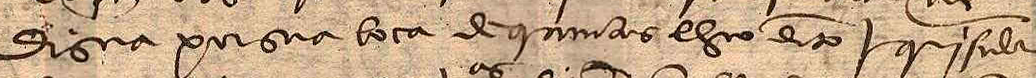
disera por sua boca de quamtos lhe o dito Jnqujsidor
